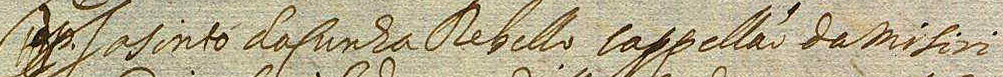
O p.e Jasinto da Cunha Rebelo cappellaõ da miseri
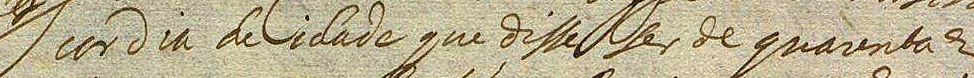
cordia de idade que disse ser de quarenta E
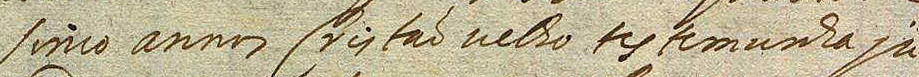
sinco annos Cristaõ uelho testemunha ju
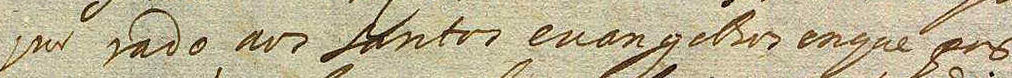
rado aos santos euangelhos en que pos
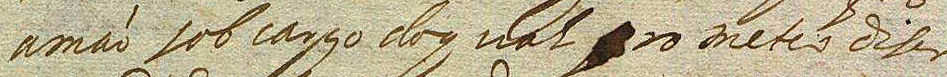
a maõ sob cargo do qual prometeo diser
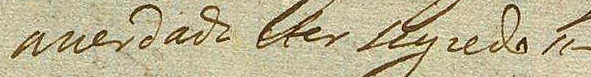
a uerdade e ter segredo //
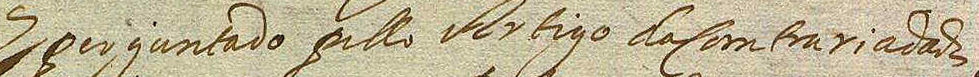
E perguntado pello Artigo da Comtrariadade
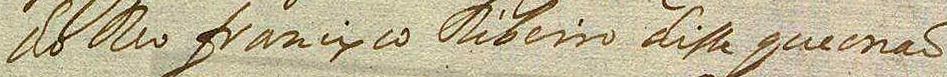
do Reo francisco Ribeiro disse que o naõ
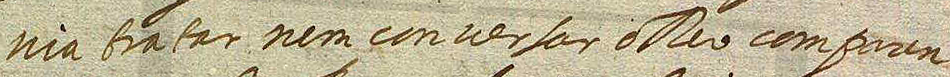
uia tratar nem conuersar o Reo com paren
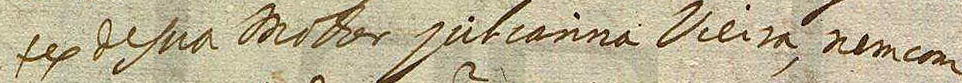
tes de sua molher julianna Vieira, nem com
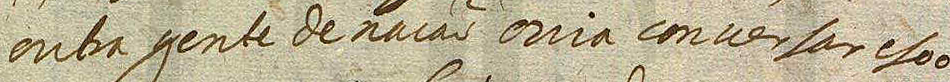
outra gente de nacaõ o uia conuersar e soo
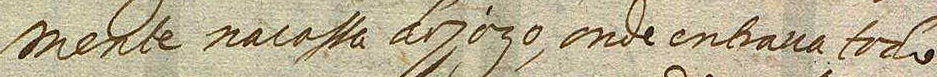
mente na cassa do jogo, onde entraua todo
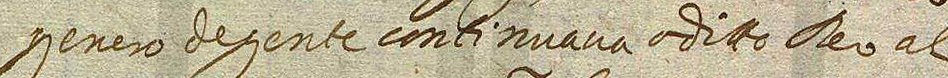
genero de gente continuaua o ditto Reo al
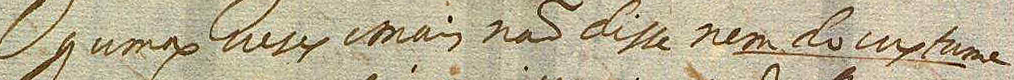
gumas ueses e mais naõ disse nem do custume
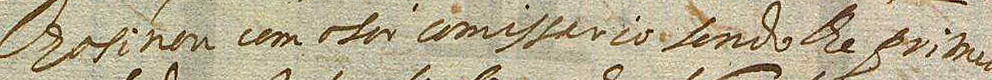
E asinou com o sor̄ comissario sendolhe primei
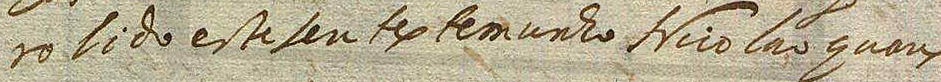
ro lido este seu testemunho Nicolao quares
